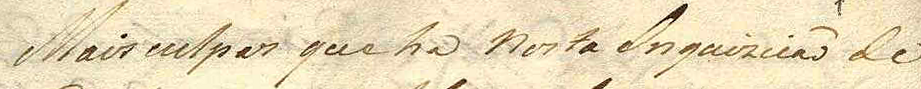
Mais culpas que ha nesta Inquizicaõ de
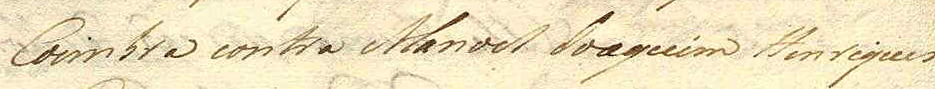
Coimbra contra Manoel Ioaquim Henriques
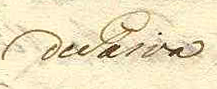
de Paiva
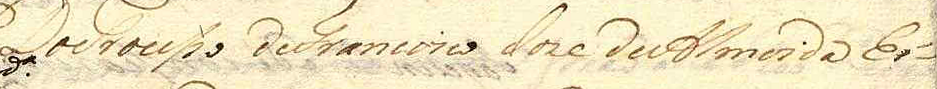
Do Processo de Francisco Ioze de Almeida Es
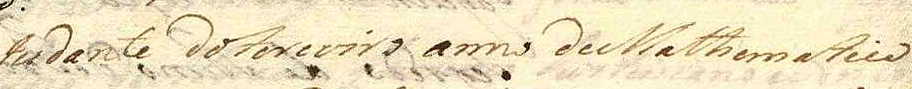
tudante do terceiro anno de Mathematica
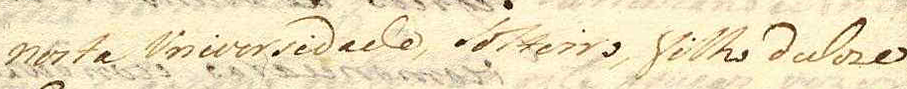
nesta Universidade, Solteiro, filho de Ioze
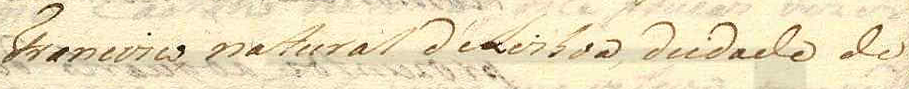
Francisco, natural de Lisboa, de idade de
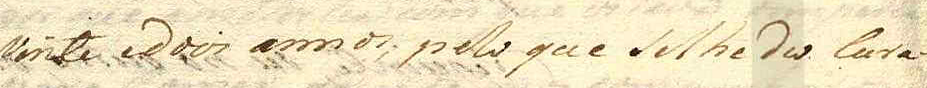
vinte e dois annos, pelo que se lhe deo Cura
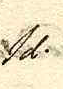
Id.
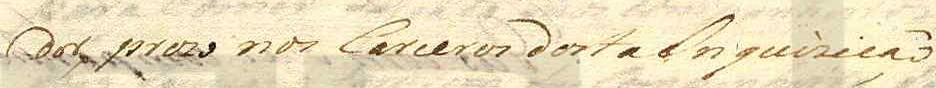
dor, prezo nos Carceres desta Inquiziçaõ
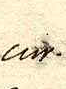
cur.
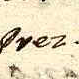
Prez.
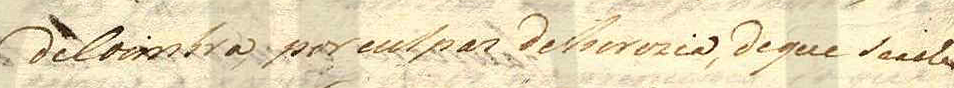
de Coimbra, por culpas de herezia, de que se acha
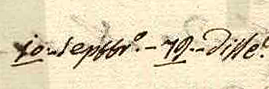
io-septbr.o -79- disse.
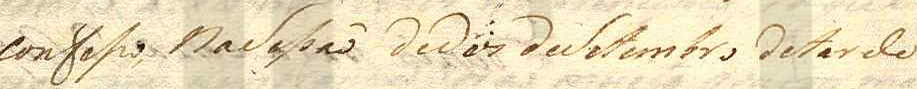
confesso, na Sessaõ de des de Setembro de tarde
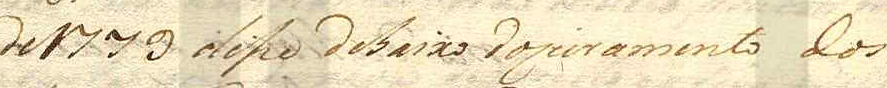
de 1779 disse debaixo do juramento dos
